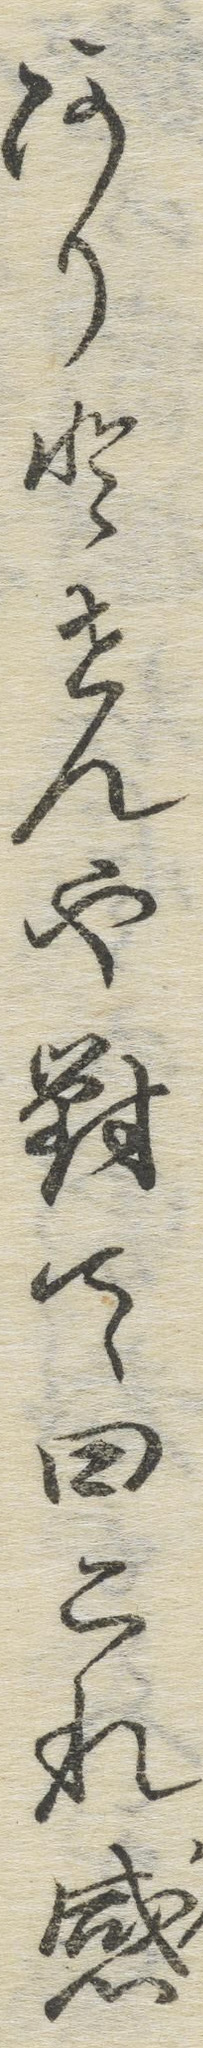ありとせんや對て曰これ感
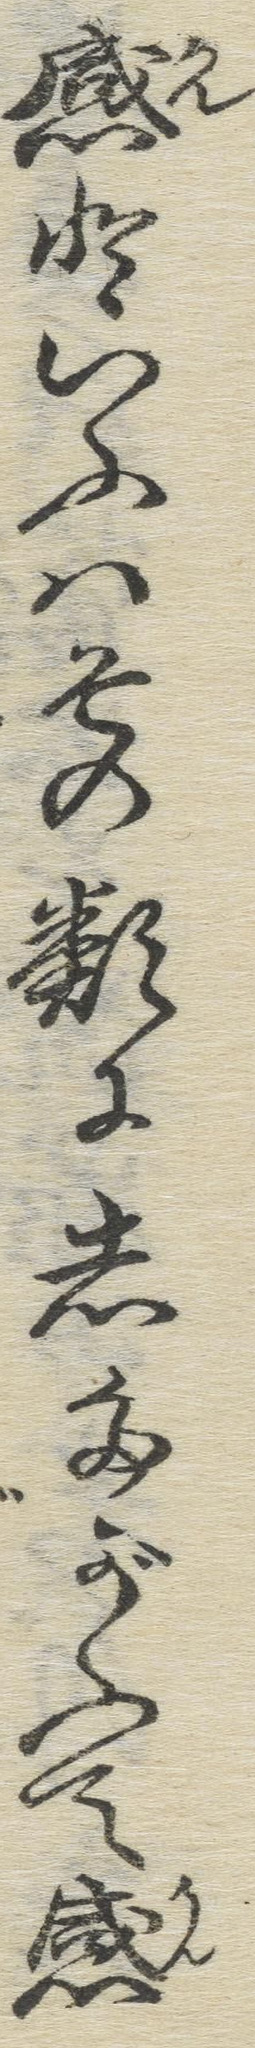感といふはその類にしたがつて感
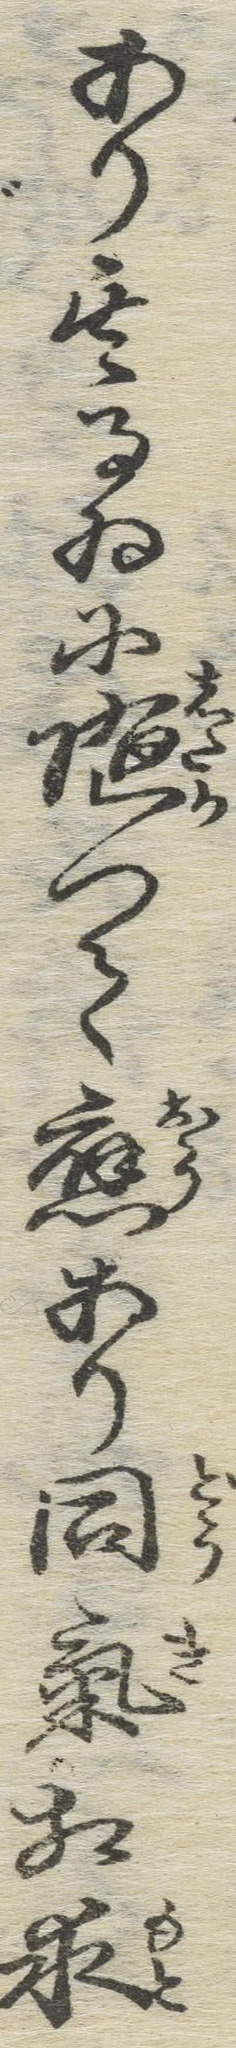あり其るゐに随つて応あり同気相求
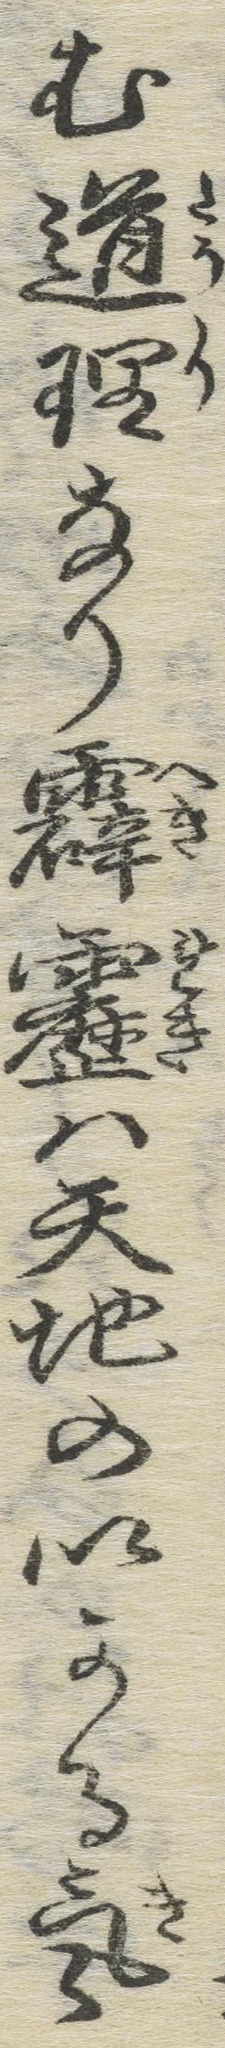む道理なり霹靂は天地のいかる気
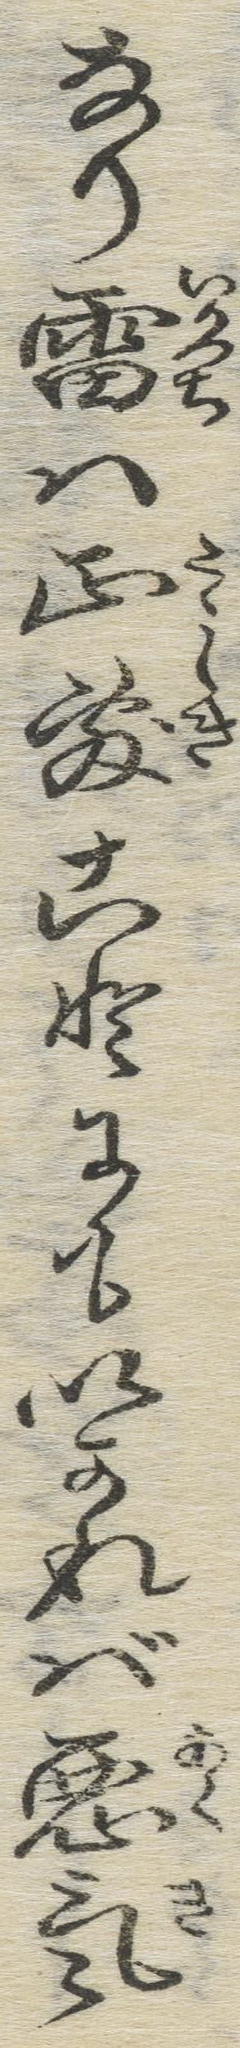なり雷は正敷ことにもいかれば悪気
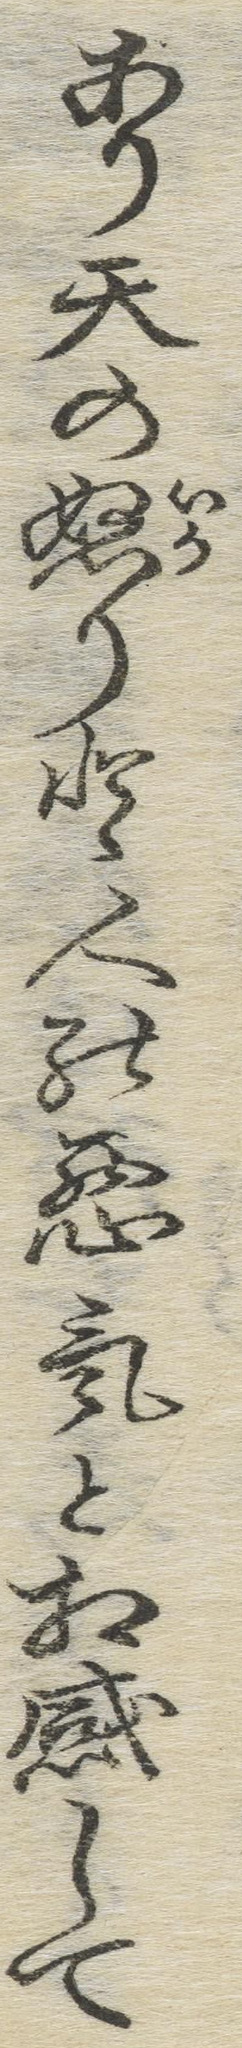あり天の怒りと人の悪気と相感して
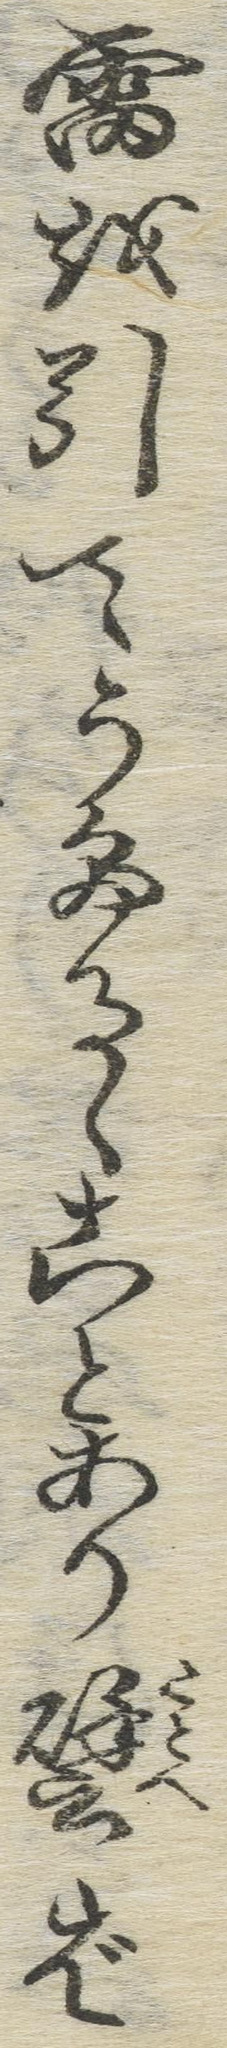雷を引てうたるゝことあり譬ば
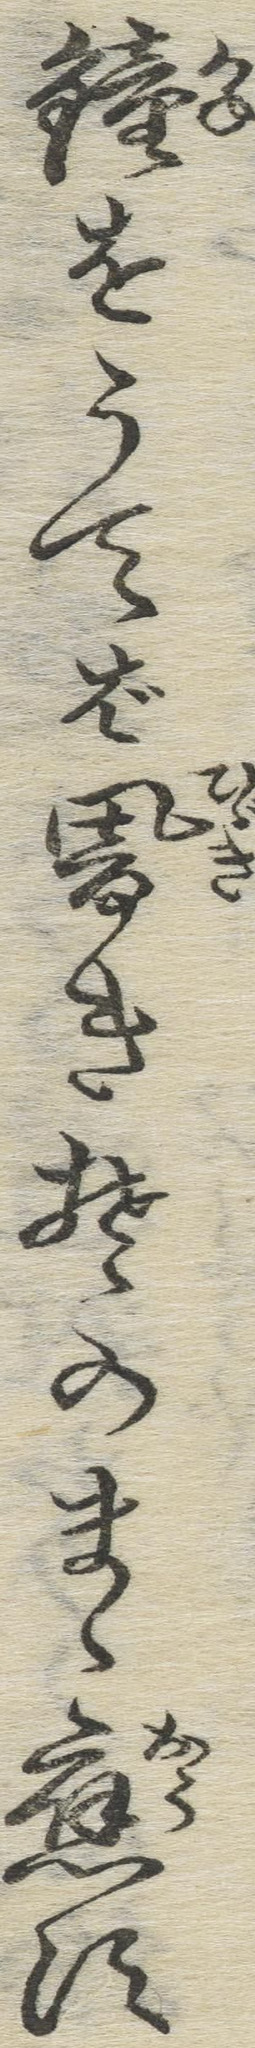鐘をうてば響きそのまゝ応す
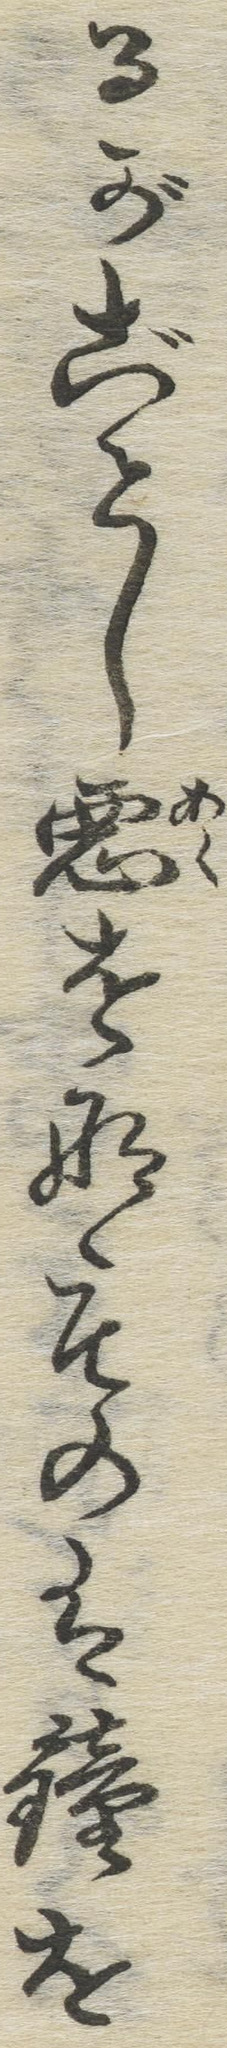るがごとし悪をなものは鐘を

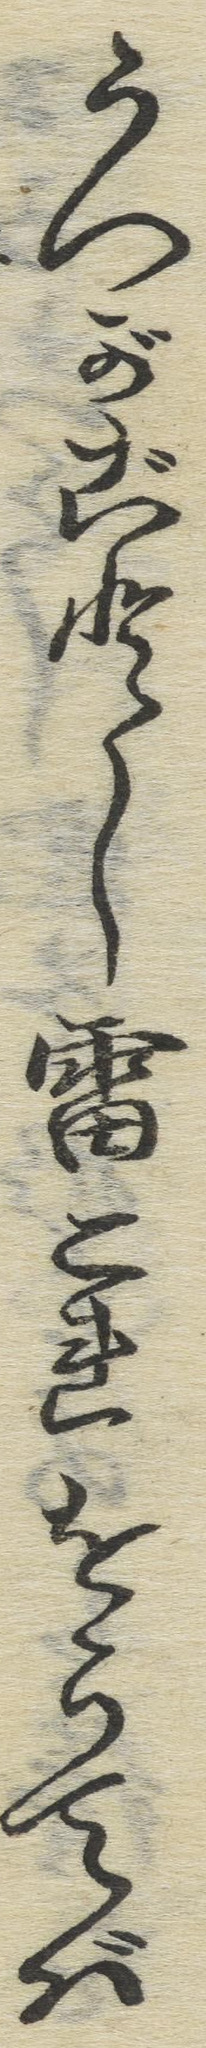うつがごとし雷これをうてば
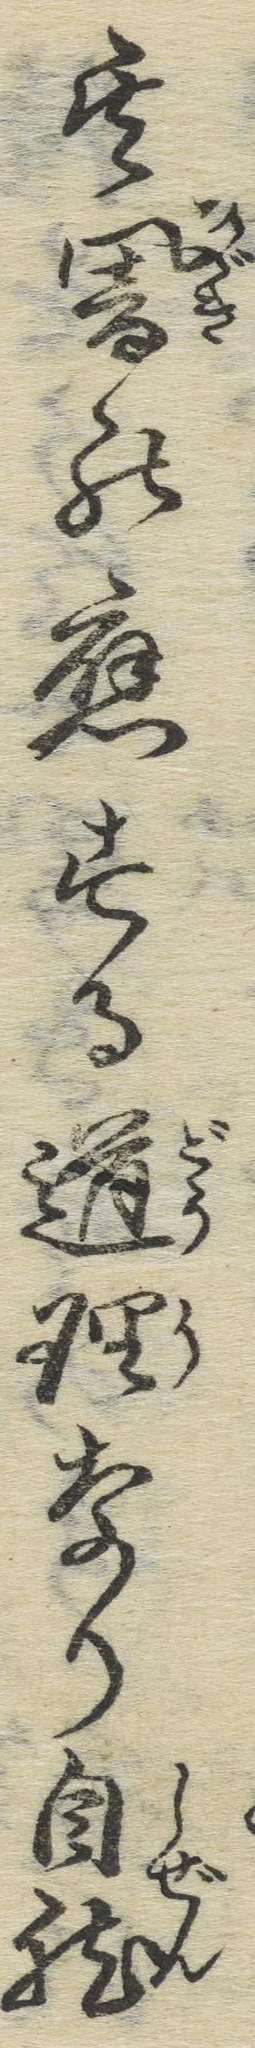其響の応する道理なり自然
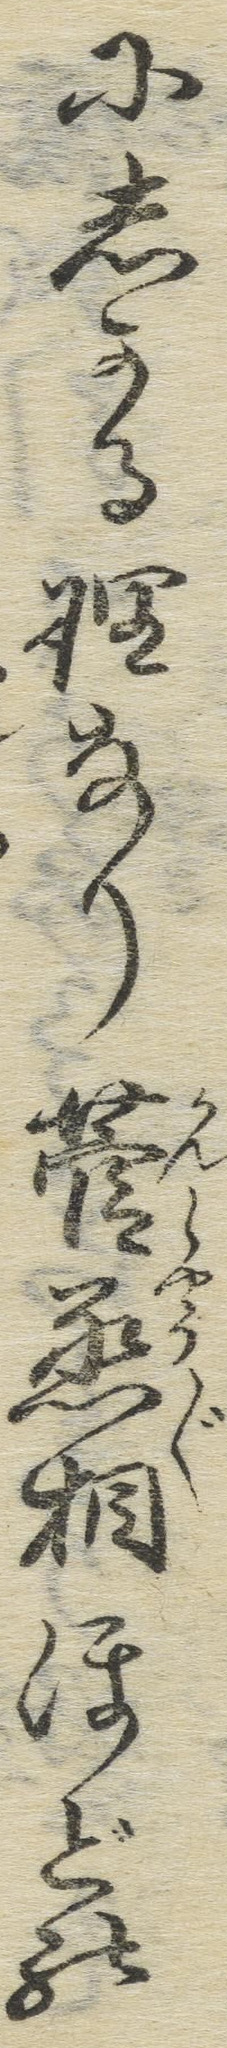にしかる理なり菅丞相ほどの
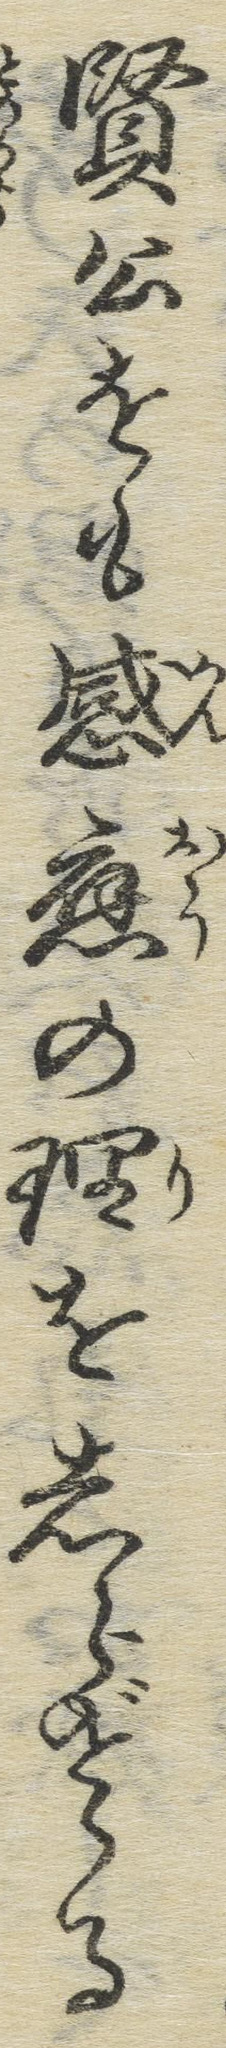賢公をも感応の理をしらざる
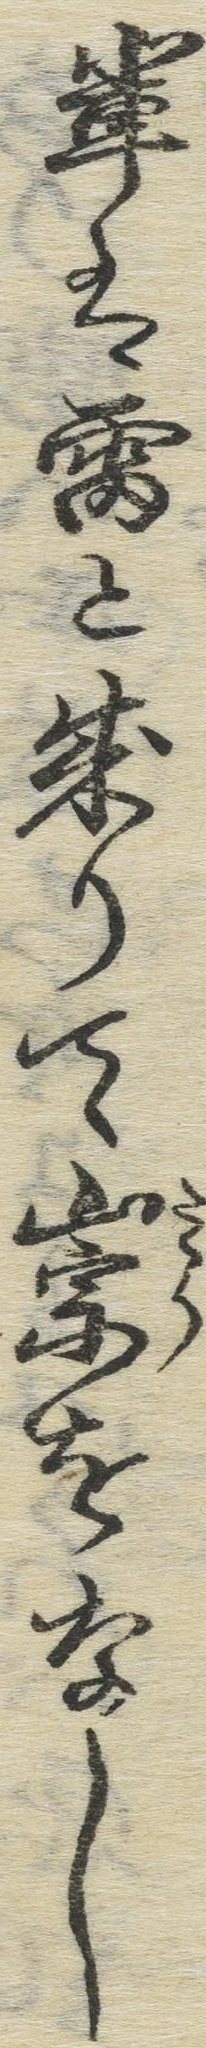輩は雷と成りて祟をなし
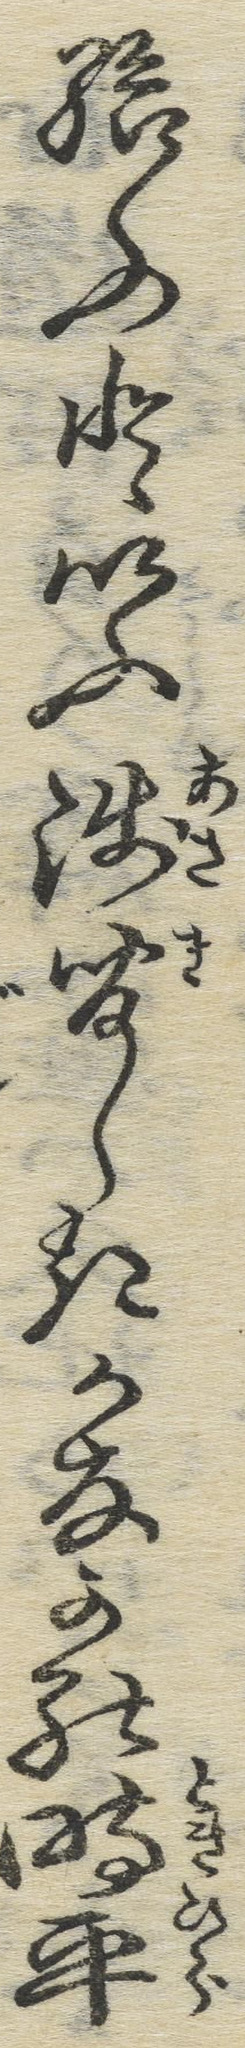給ふという浅間しきかなかの時平
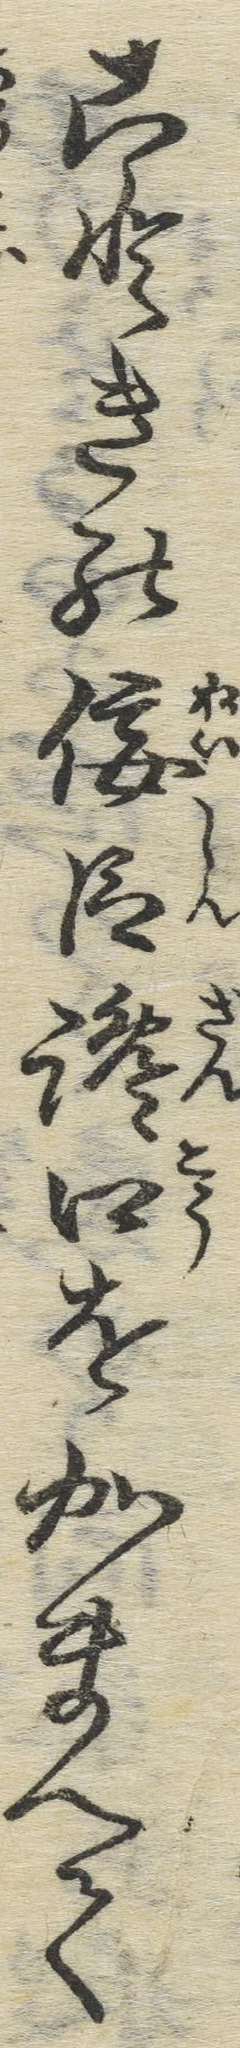こときの佞臣讒口をかまへて
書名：雷公地震由來記　全
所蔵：東京大学地震研究所図書室 Earthquake Research Institute Library, The University of Tokyo, JAPAN
